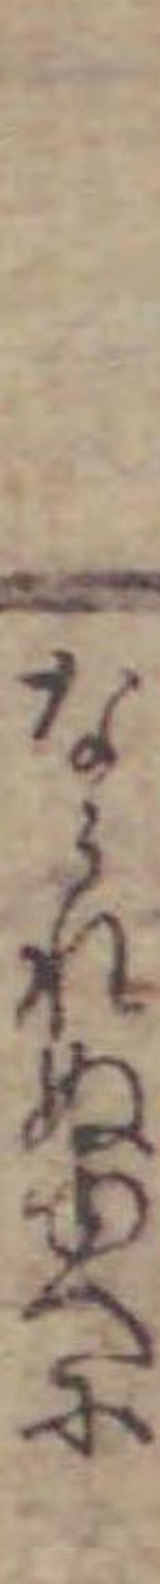なられぬゆへに
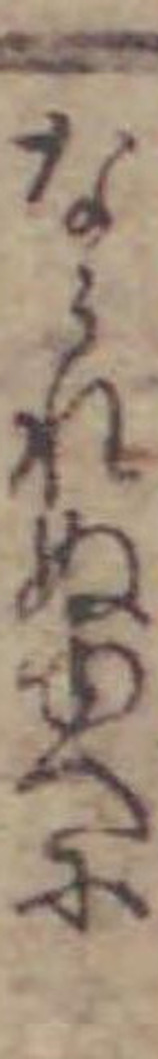なられぬゆへに
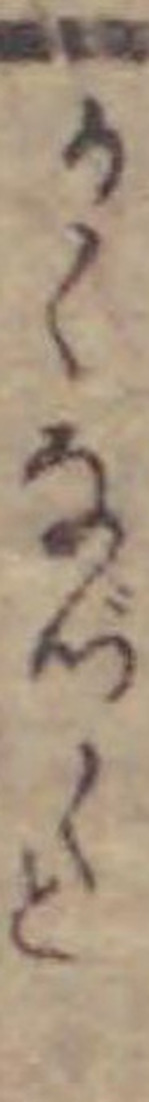かくなつくと
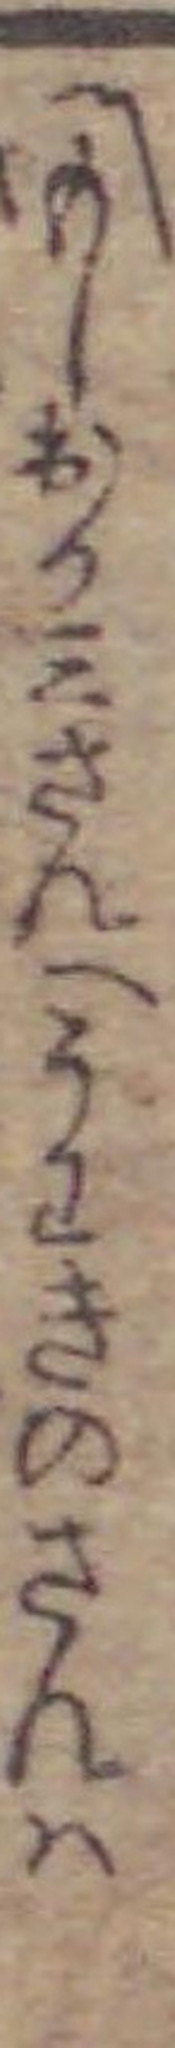「もしおかみさんへうわきのさんは
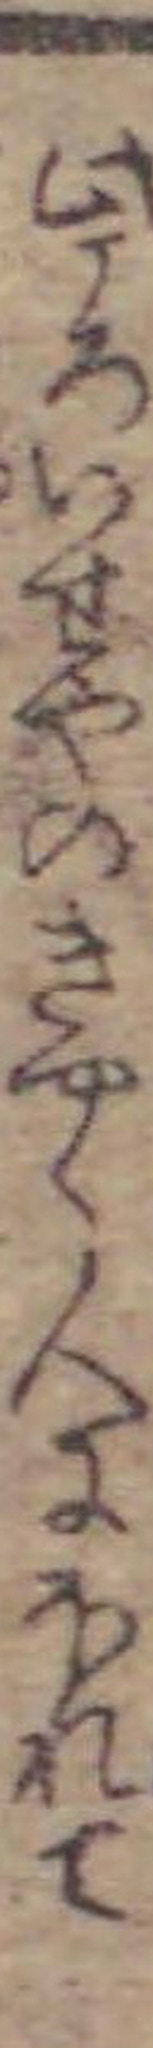此ころいせやのきやく人にほれて
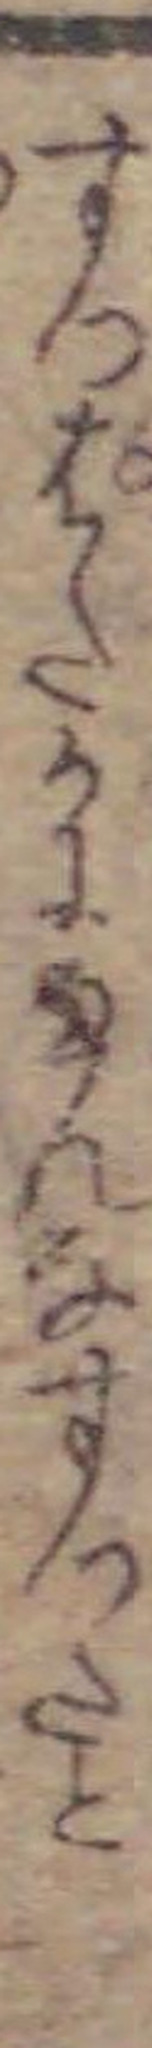すつぱたかになんなんすつたと
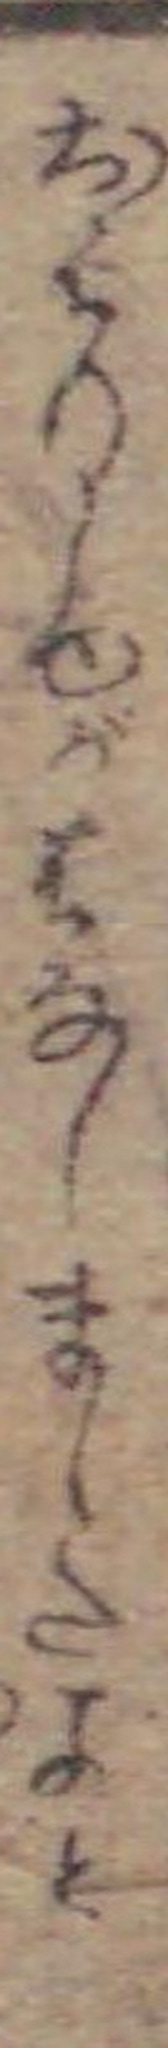おはりしゆがはなしましたよと
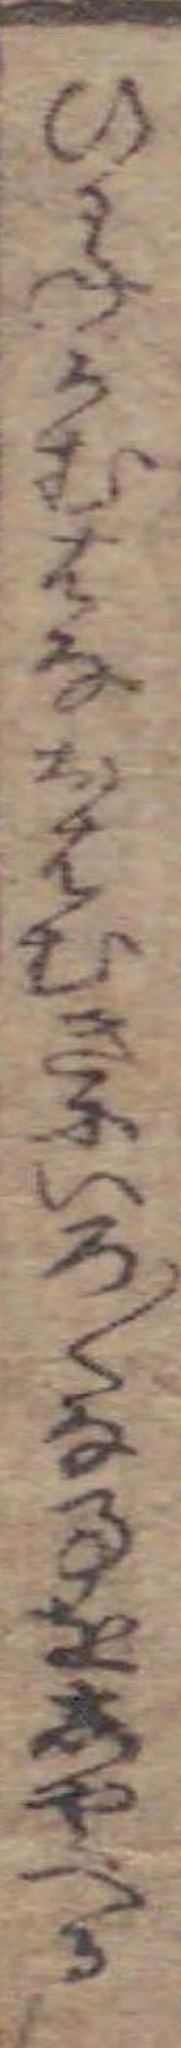ひるねかむはなおはむきにいろ〳〵な事をしやべる

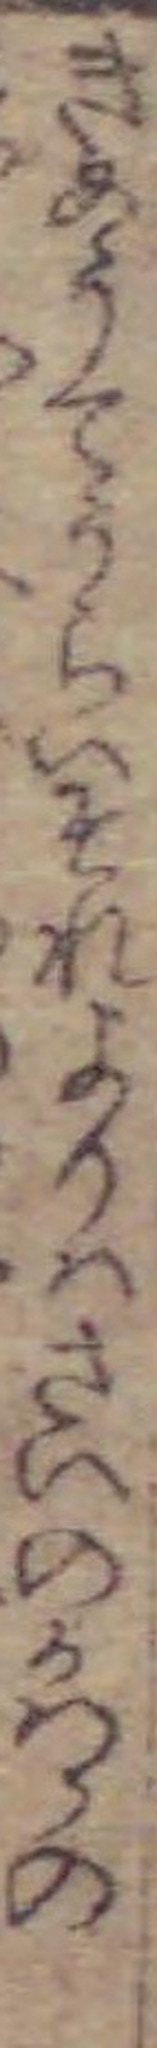きめうてうらいそれよりはさいのかはらの
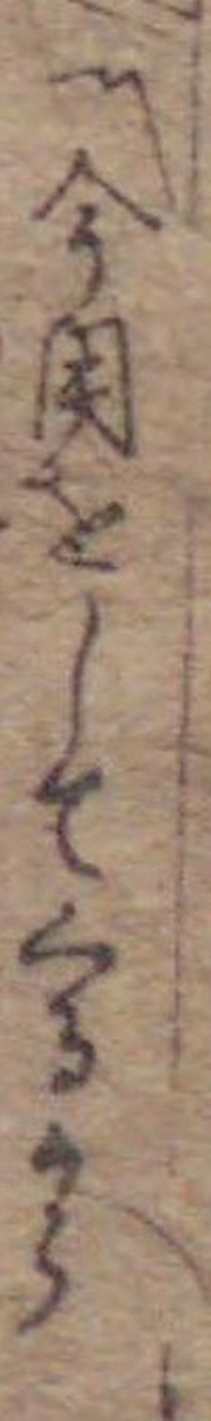「今用をしてくるから
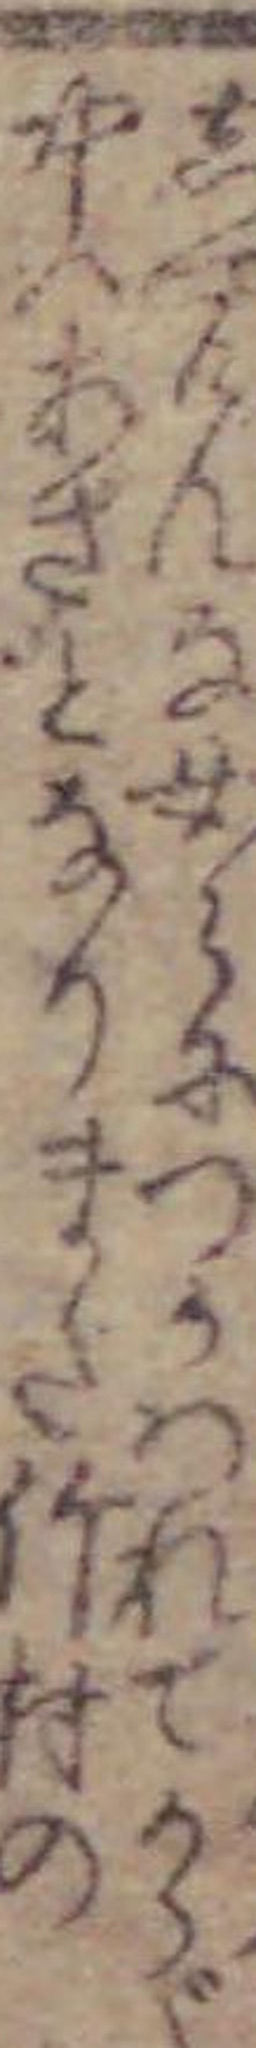中はあざとなりまた竹村の
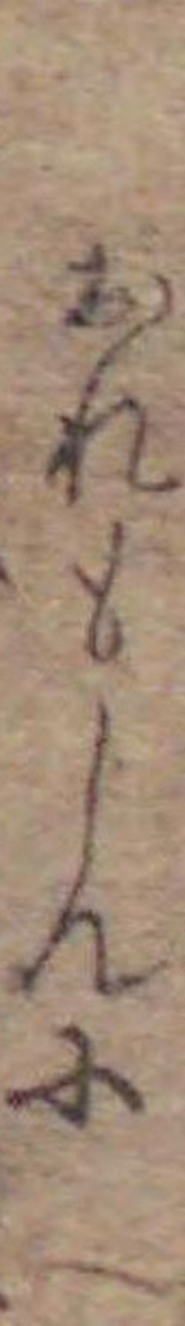おれもしんに
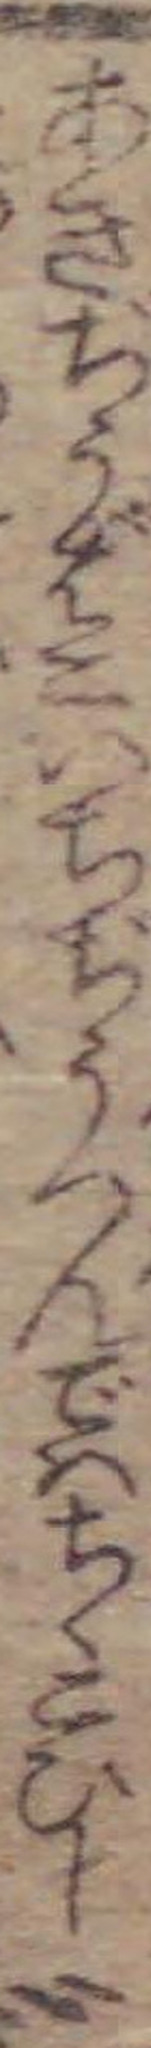あきぢうはこいちぢうつんではちゝこひし
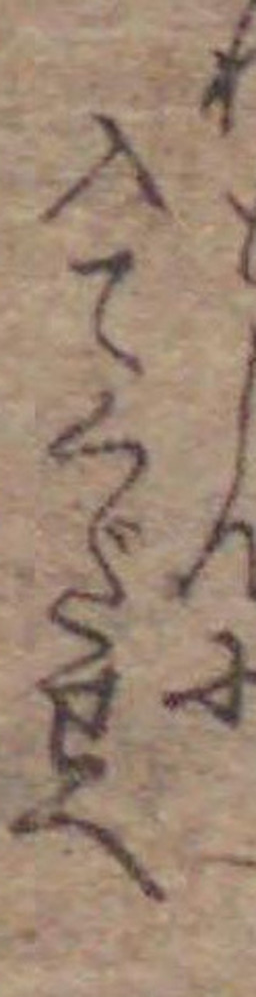入てくだせへ
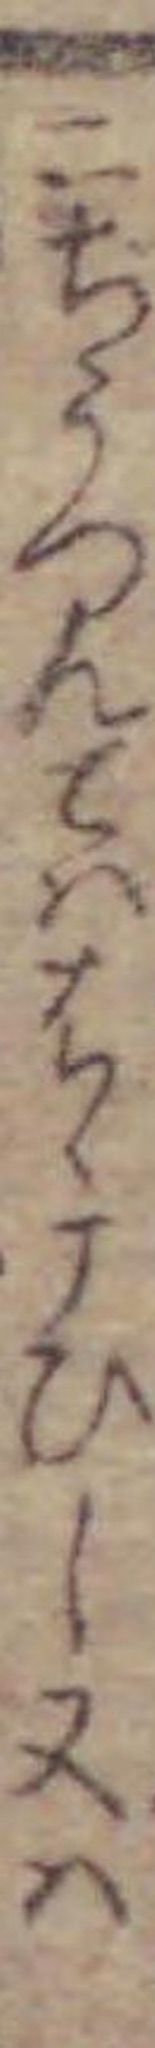二ぢうつんてははゝこひし又は
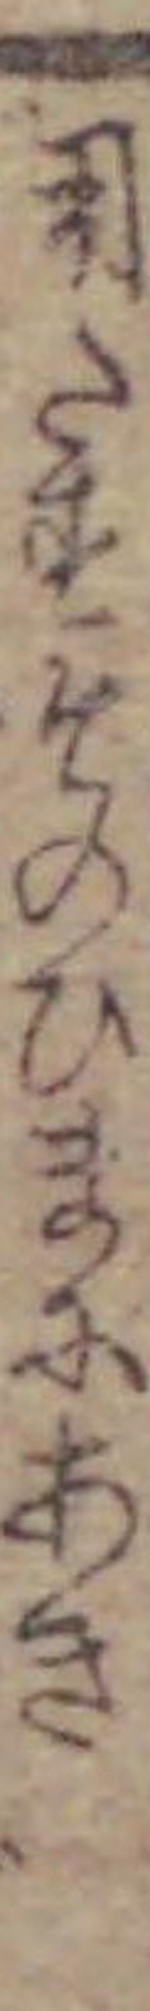用たすそのひまにあき
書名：九替十年色地獄 : 3巻
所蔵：国立国会図書館 National Diet Library, JAPAN
